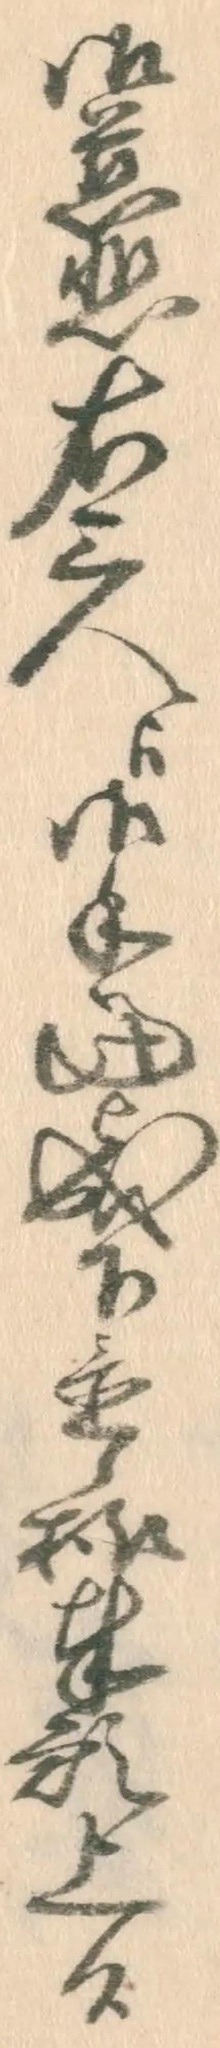御慈悲右三人え御手当被成下置候様奉願上候
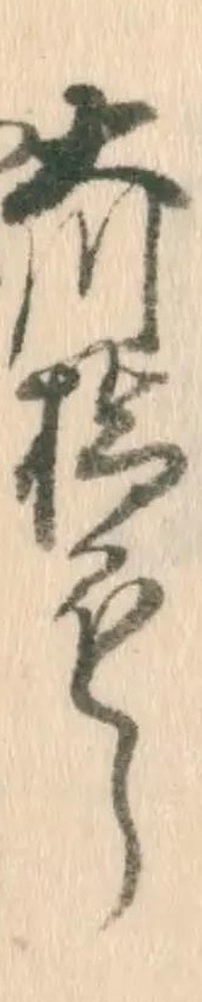大川橋懸り
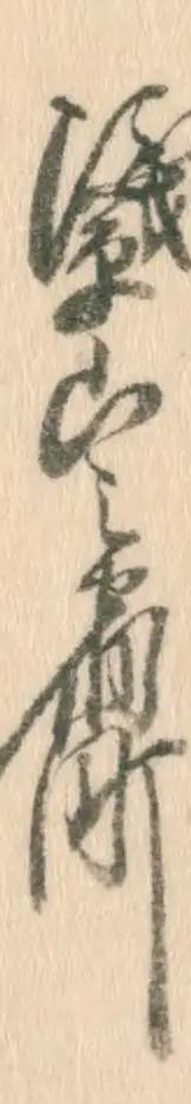浅草山之宿町
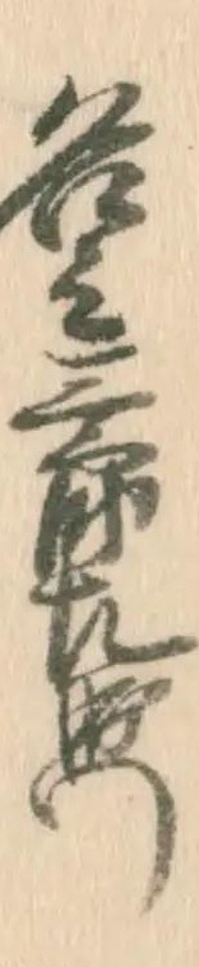名主三郎左衛門
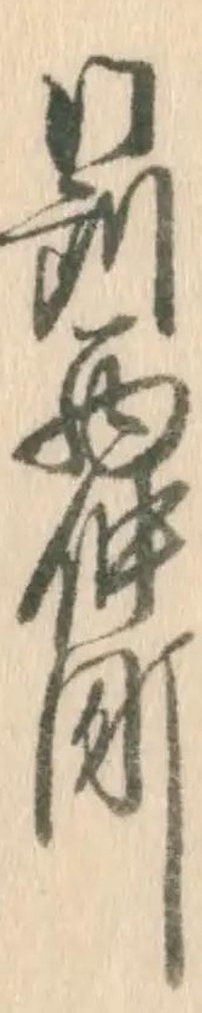同所西仲町
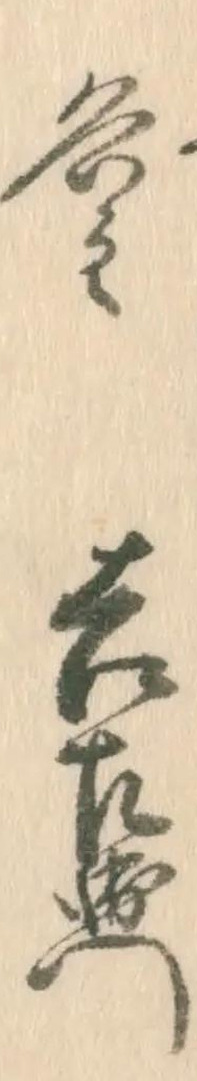名主吉左衛門
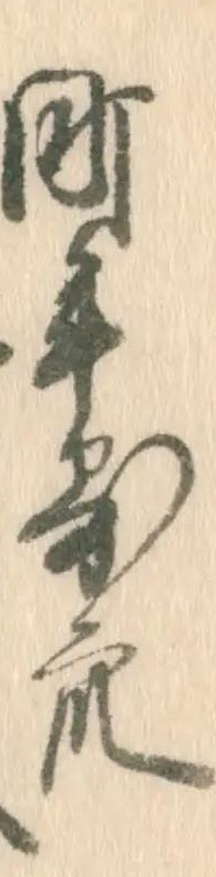町年寄衆
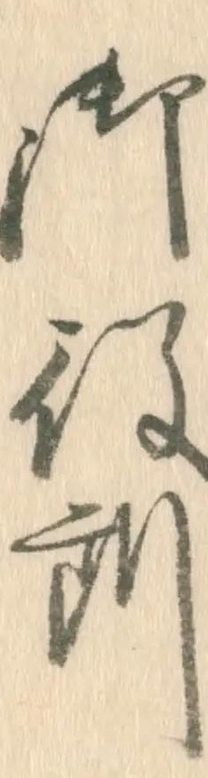御役所
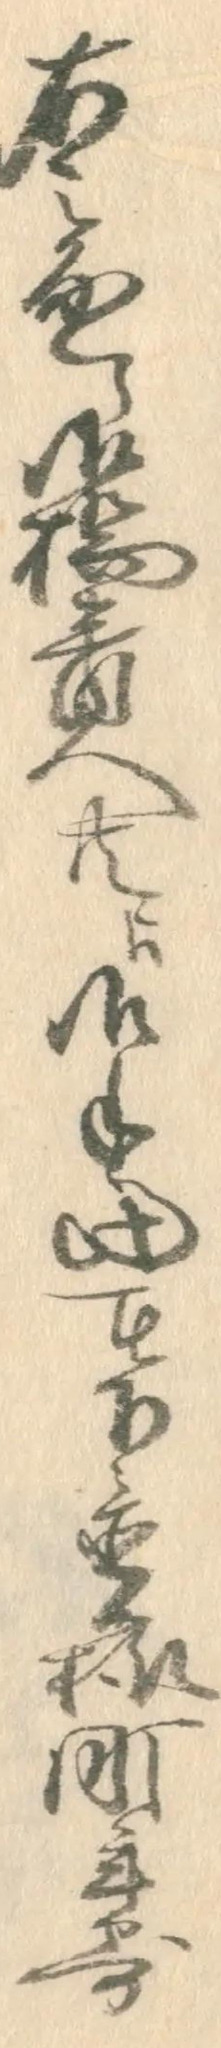右之通り御橋番人共え御手当被下置候様町年寄
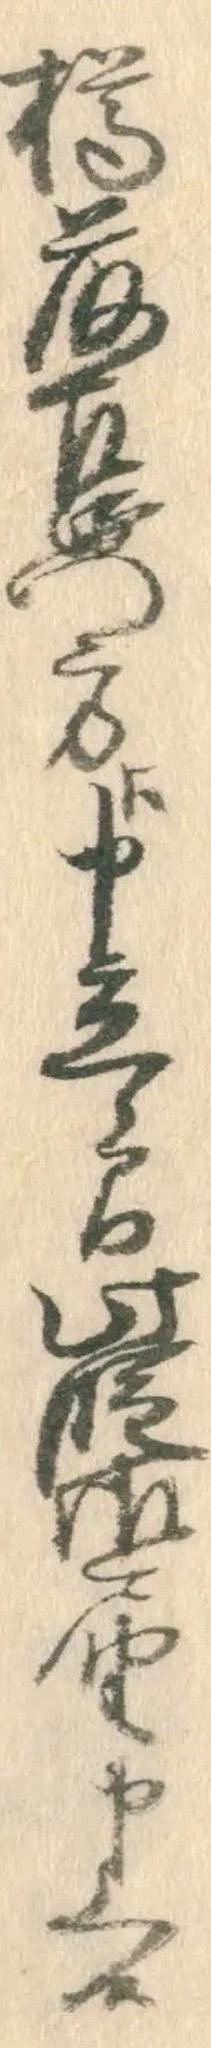樽藤左衛門方え申立候間此段御届申上候

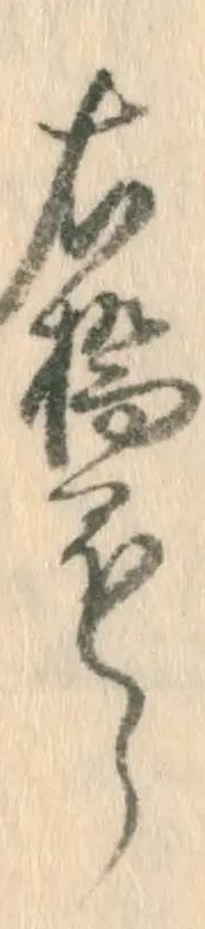右橋懸り
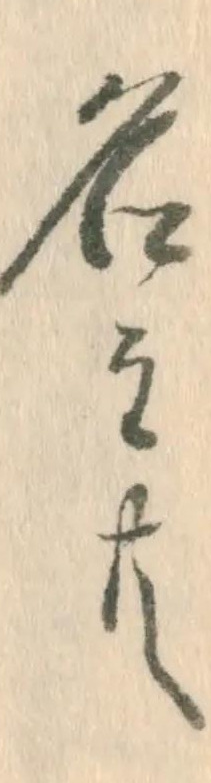名主共
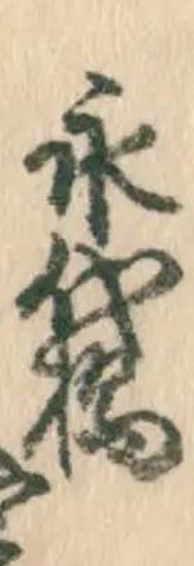永代橋
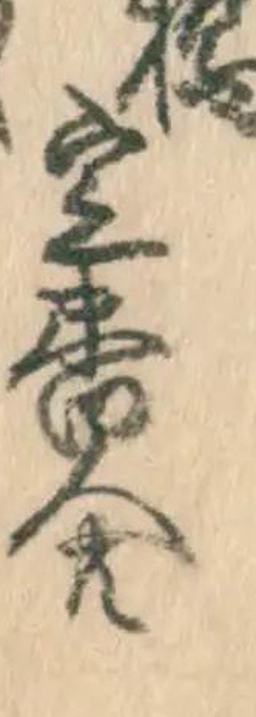定番人共
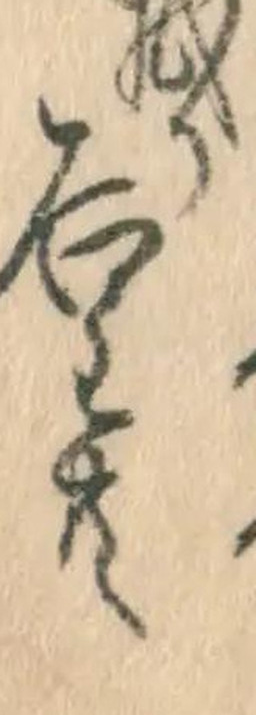名主共

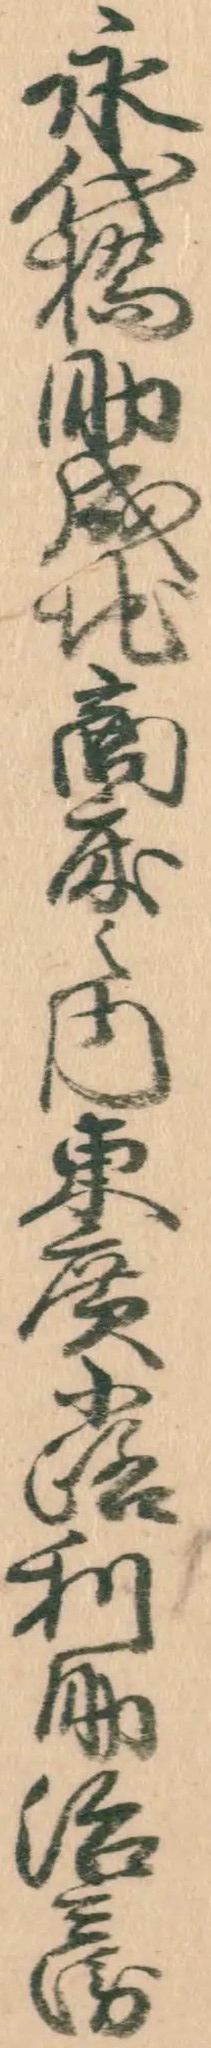永代橋助成地商床之内東広小路利助治兵衛
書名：三橋 17巻. [8] 三橋小破御修復書留　但御奉行御掛リ替地震潰橋番屋　嘉永四亥年より安政二卯年迄　下
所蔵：国立国会図書館 National Diet Library, JAPAN
